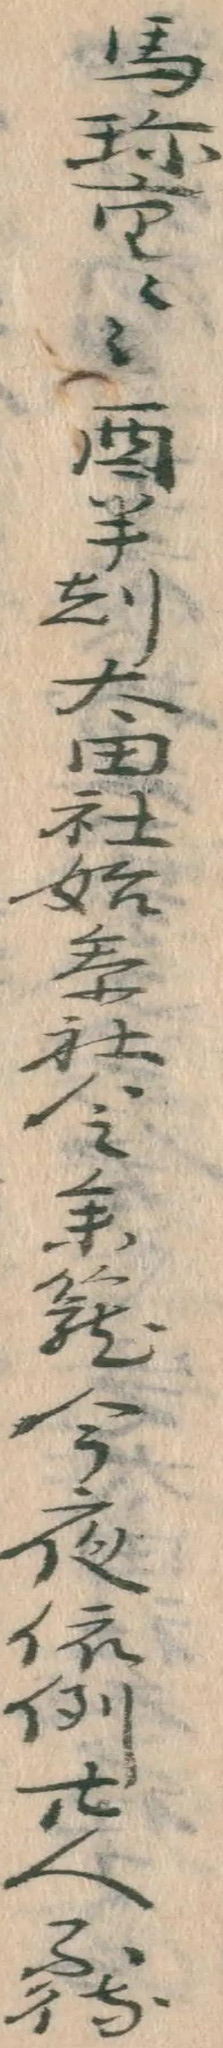馬珍重々々酉半刻太田社始参社令参籠今夜依例廿人不待
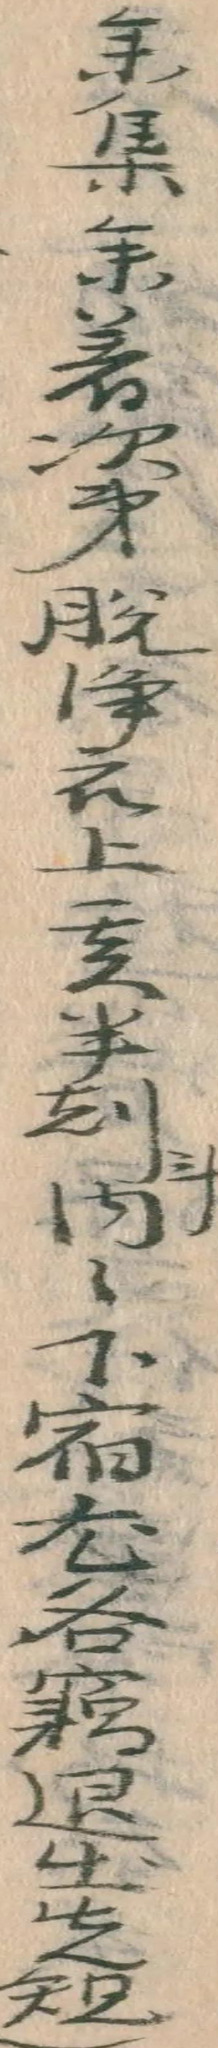参集参着次第脱浄衣上亥半刻斗内々下宿尤各竊退出先規也
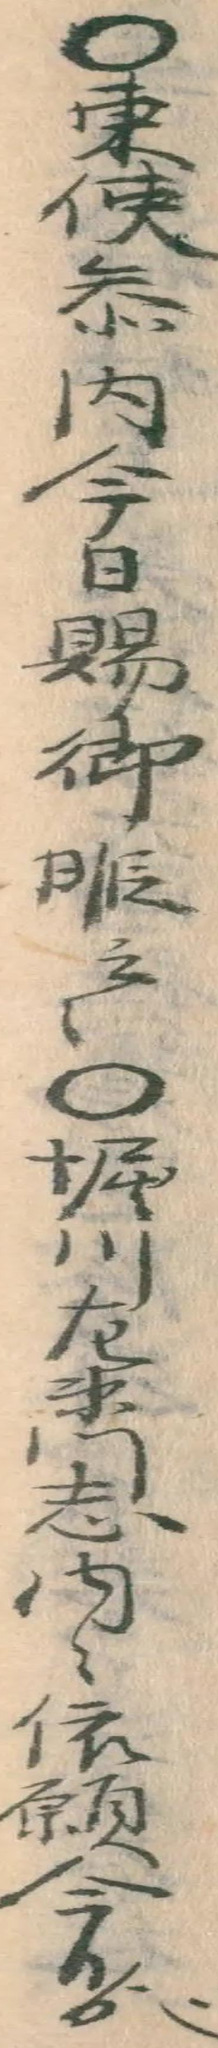○東使参内今日賜御暇云〻○堀川左衛門志内〻依願今日ゟ
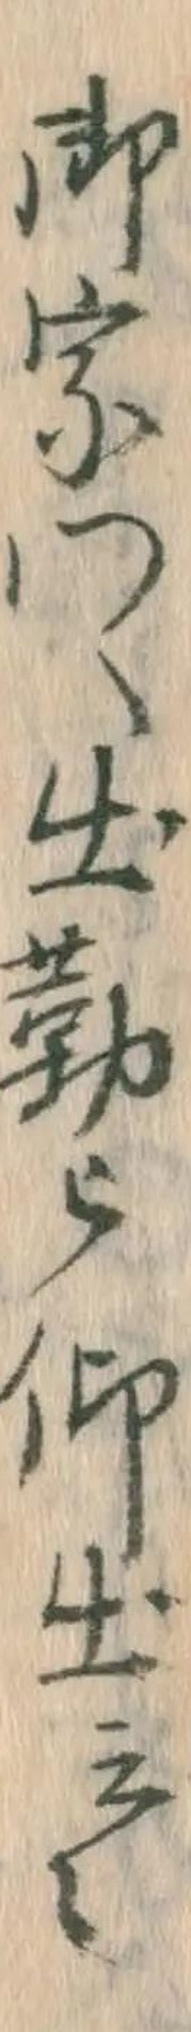御家門へ出勤被仰出云々
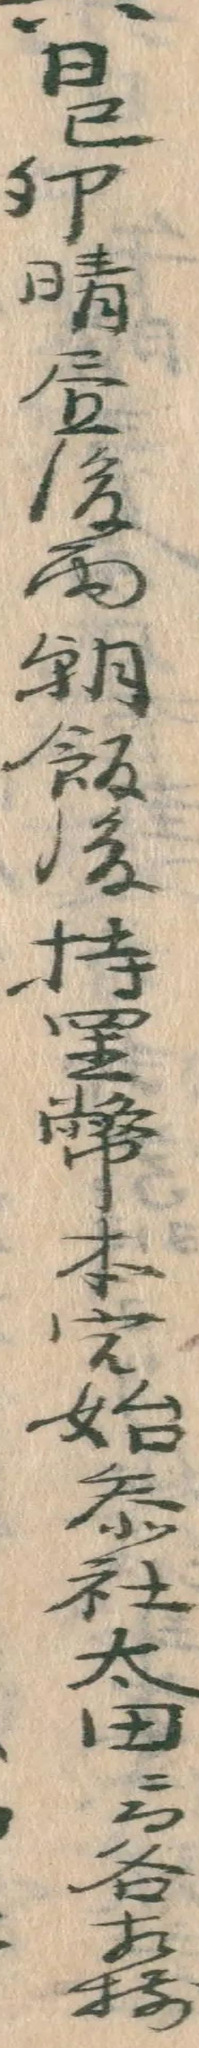六日巳卯晴昼後雨朝飯後持置幣本宮始参社太田ニ而各相揃
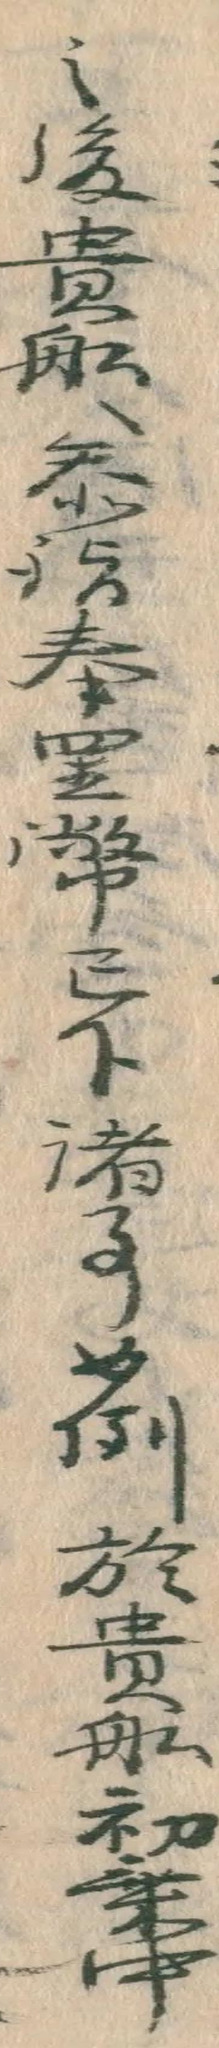之後貴船へ参詣奉置幣已下諸事如例於貴船初乗中
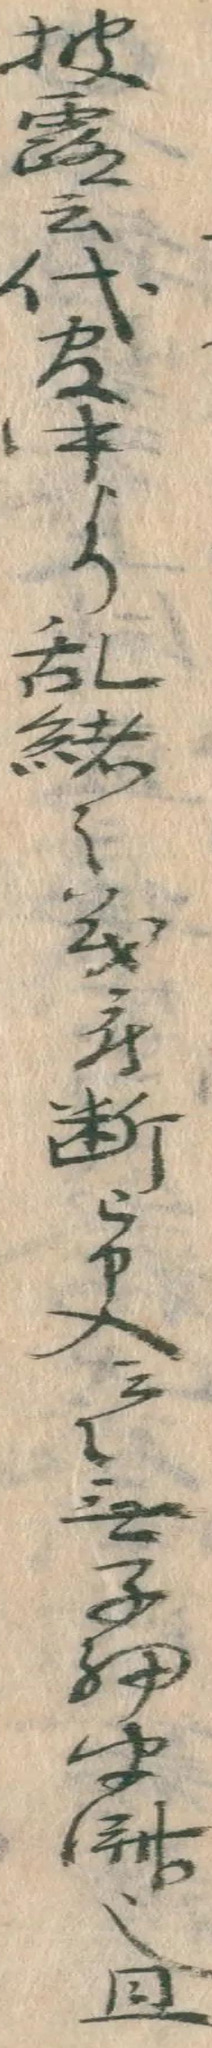披露云代官中より乱緒之義ニ付断被申入云〻無子細聞済也且
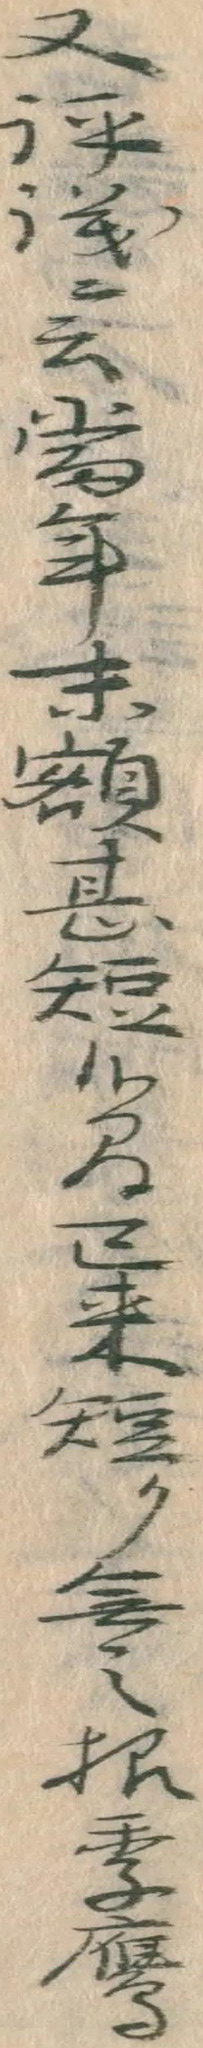又評議ニ云當年末額甚短候間已来短ク無之様季鷹
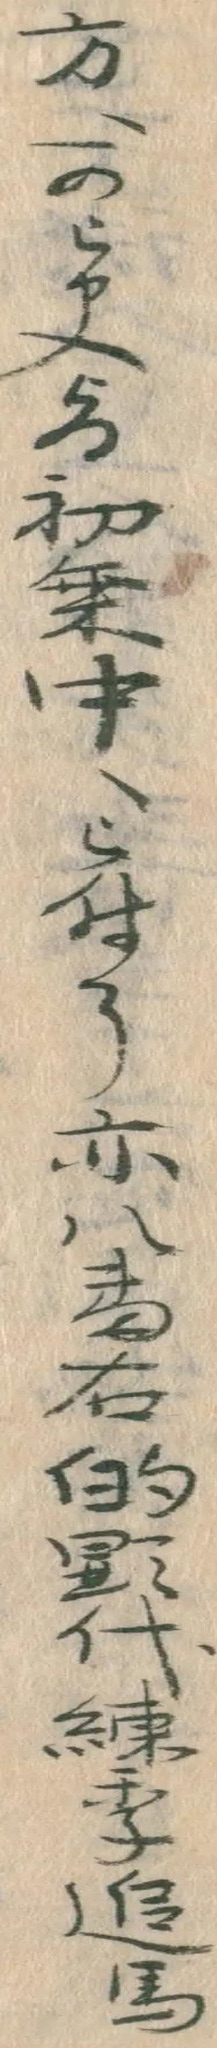方へ可被申入旨初乗中へ被付了亦八番右的野代練季追馬
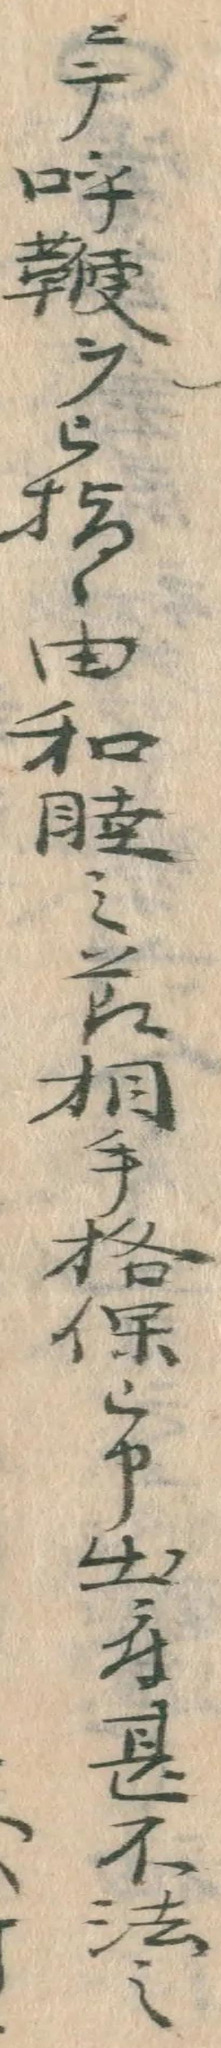ニテ呼鞭ヲ被指候由和睦之節相手格保被申出ニ付甚不法之
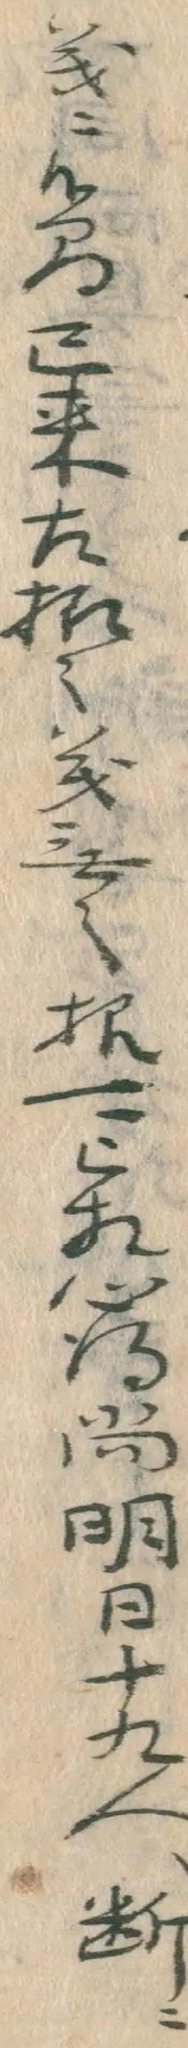義ニ候間已来左様之義無之様可被相心得尚明日十九人断ニ
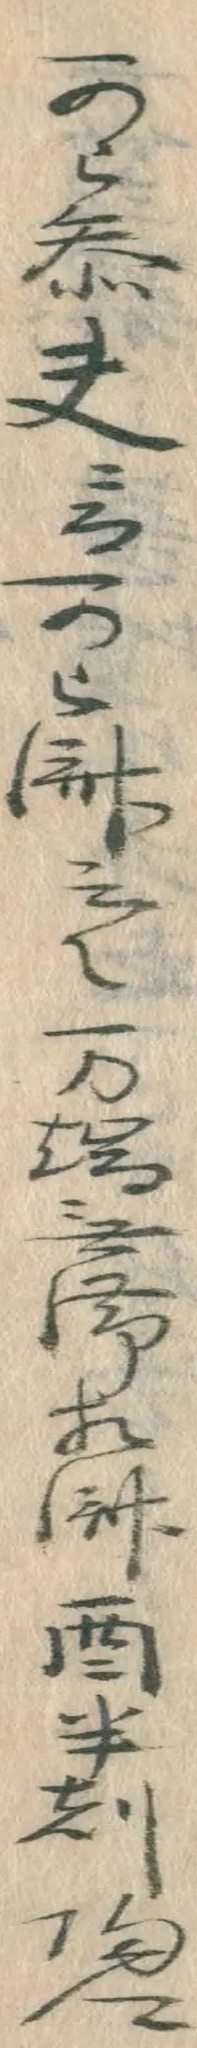可被参夫ニ而可被済云々万端無滞相済酉半刻帰郷
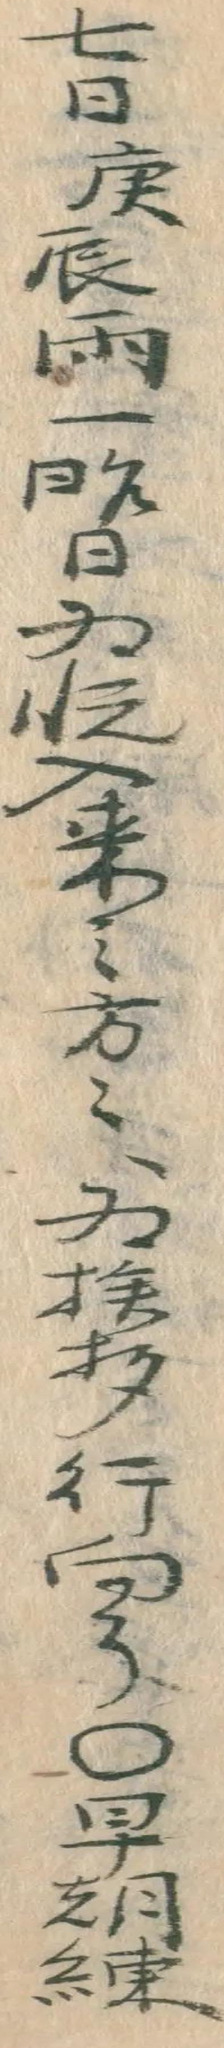七日庚辰雨一昨日為悦入来之方々へ為挨拶行向了○早朝練
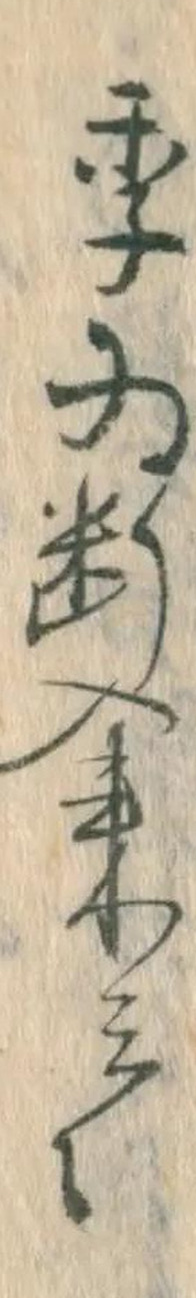季為断入来云々
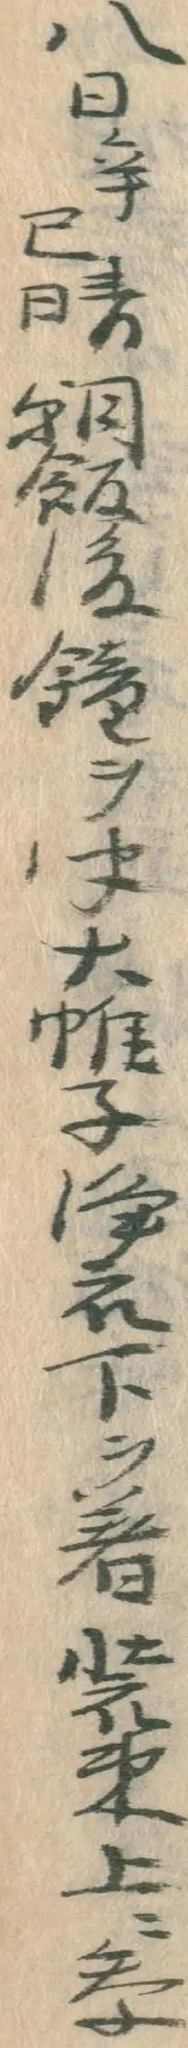八日辛巳晴朝飯後鐘ヲ聞大帷子浄衣下ヲ着装束上ニ参

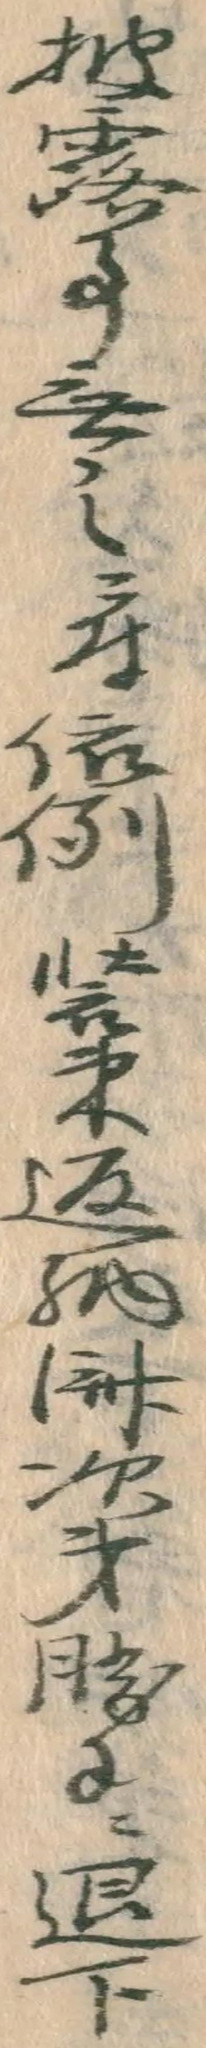披露事無之ニ付依例装束返納済次第勝手ニ退下
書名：賀茂社記録. 第63冊
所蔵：国立国会図書館 National Diet Library, JAPAN
